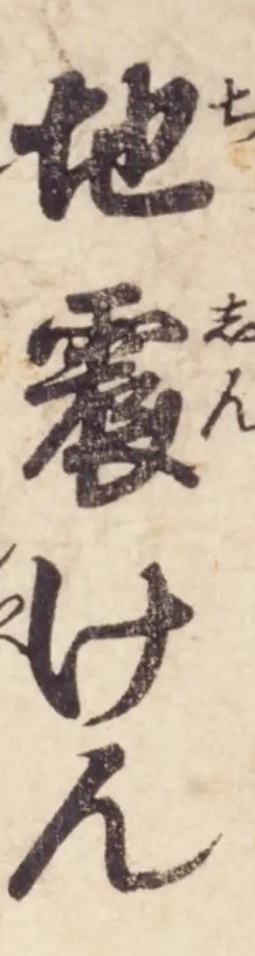地震けん
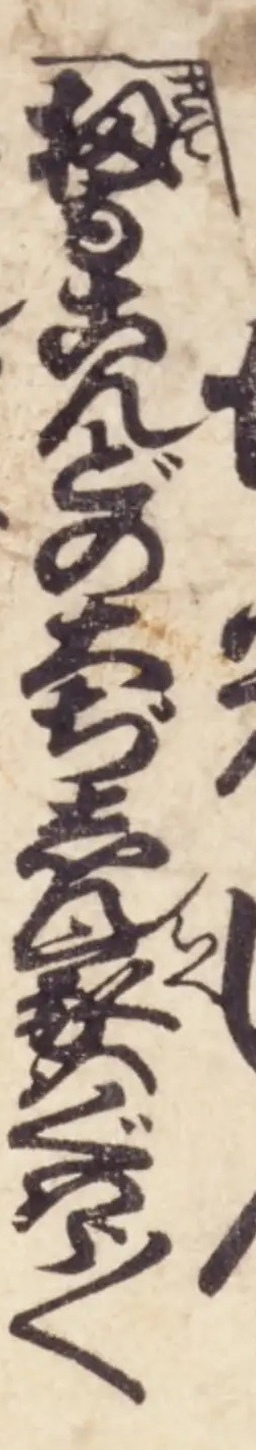「扨もこんどの大ぢしん家はぐはら〳〵
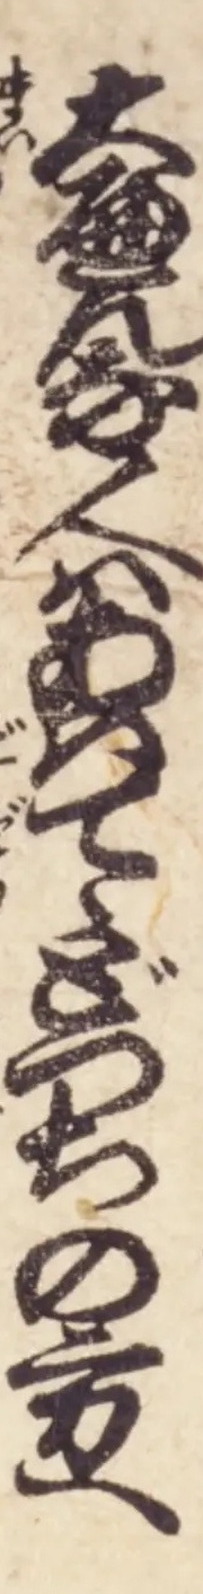大へんな人はあはてゝどつちの方へ
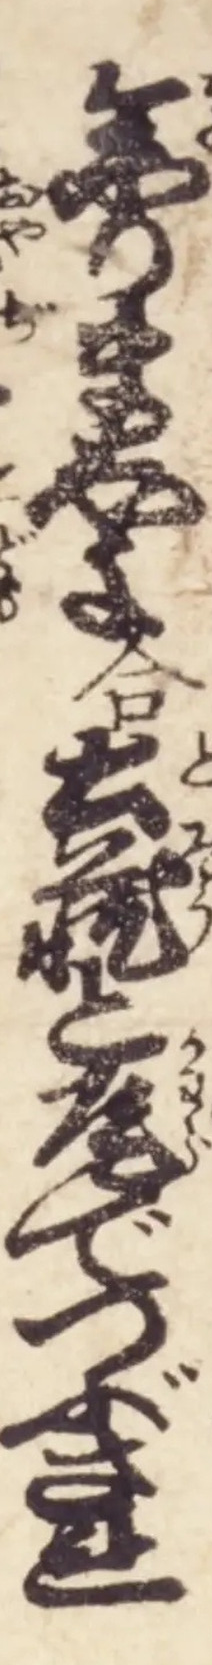参りましよ合土蔵と瓦でつぶされ
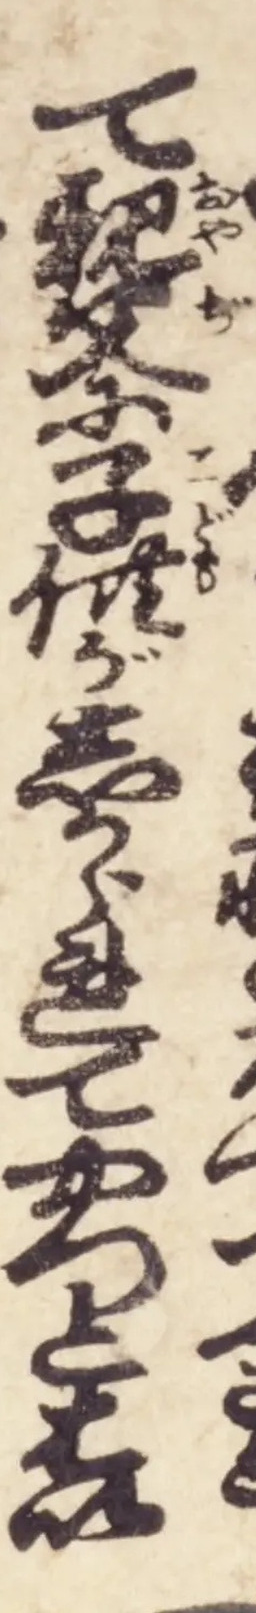て親父に子供がしかられてやつとはい
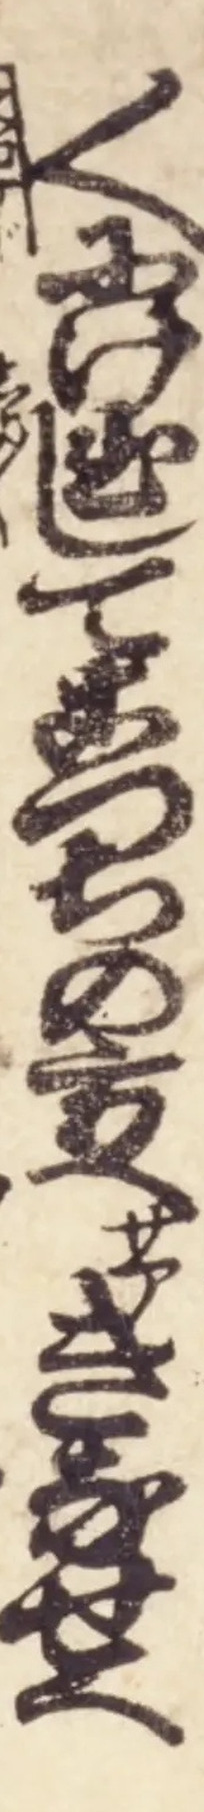〳〵にけ出してこつちの方へサアきなせへ
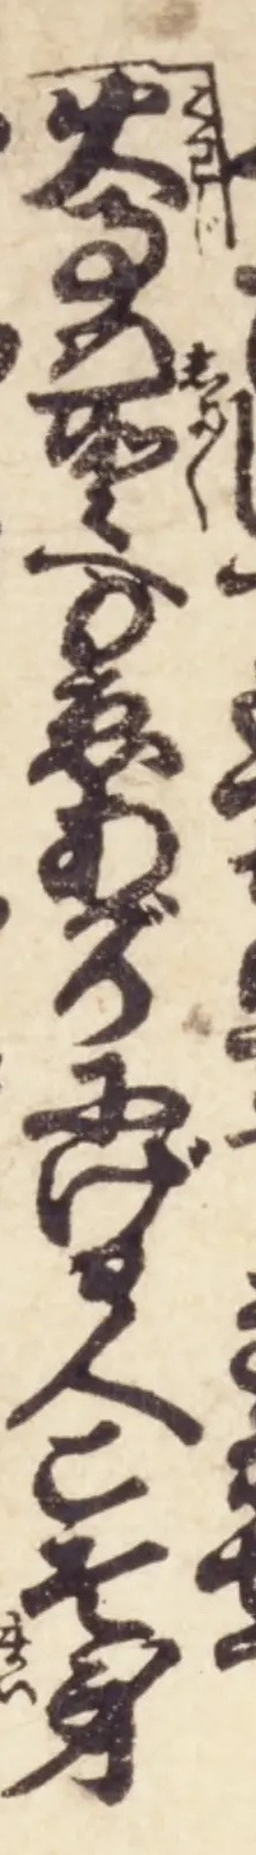「火事は所々へもゑあがりにげる人こそ身
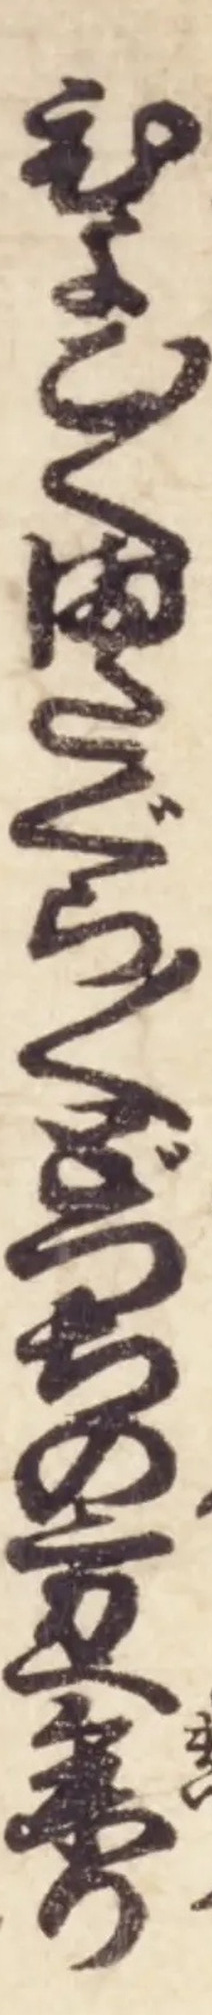ひよこ〳〵またぐら〳〵どつちの方へ参り
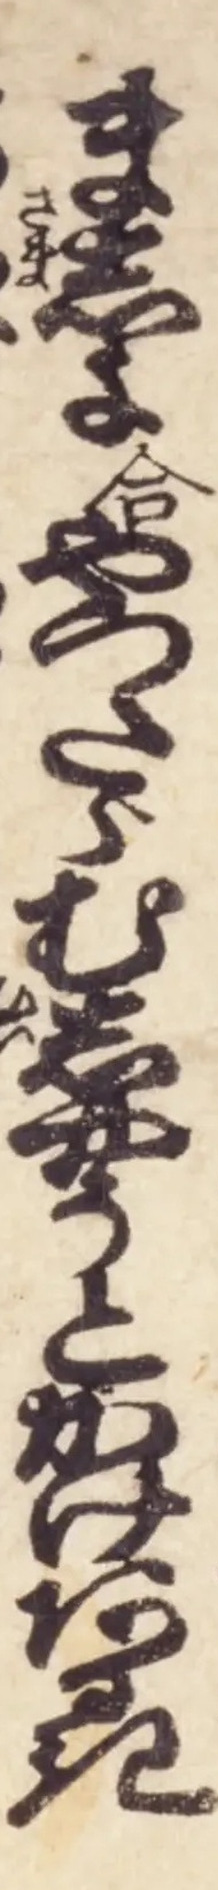ましよ合やつたらむしやうとかけあるき
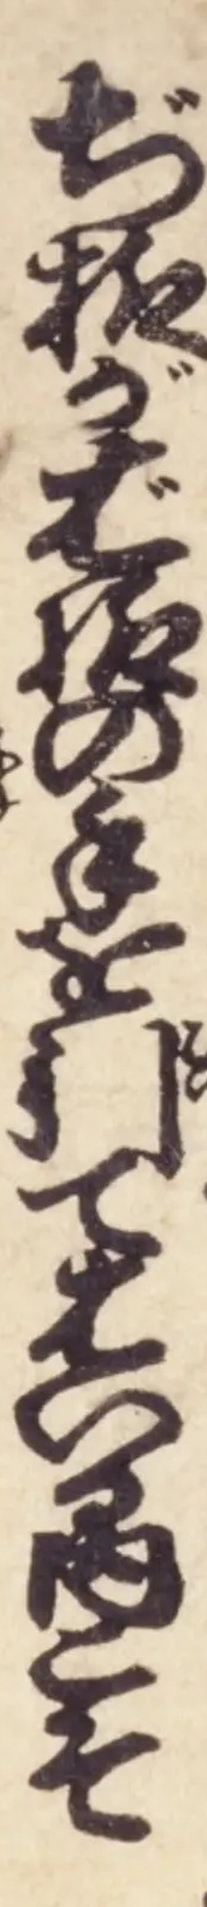ぢ様がば様の手を引てはいる内こそ
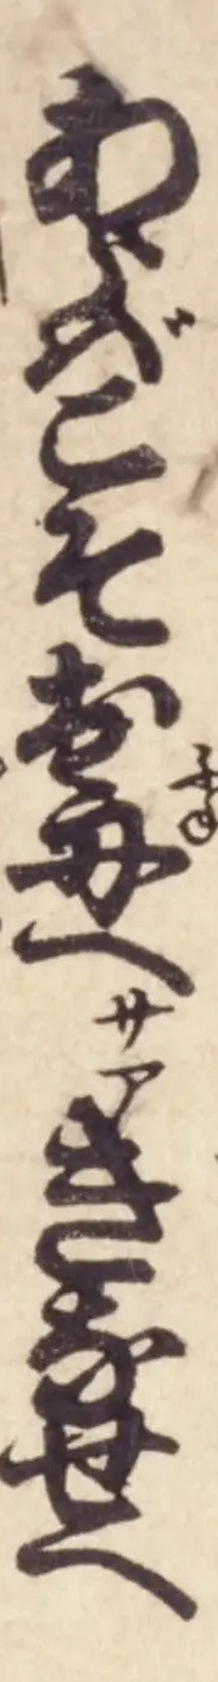あらばこそお舟へサアきなせへ
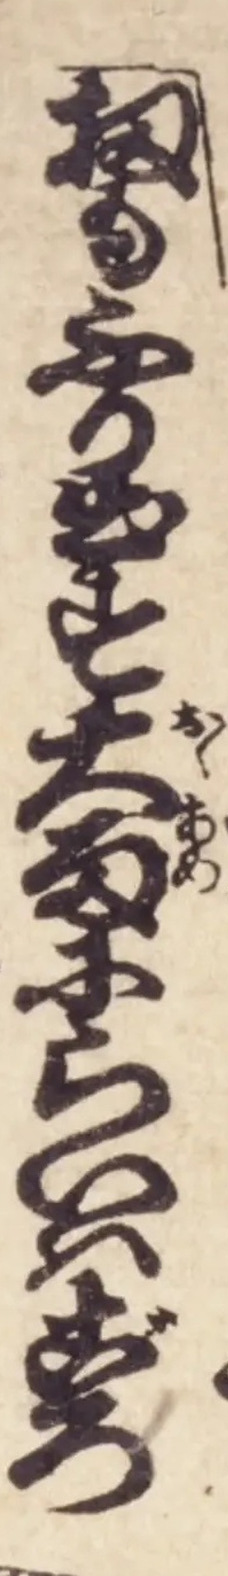「扨もふり出す大雨にらいはごろ
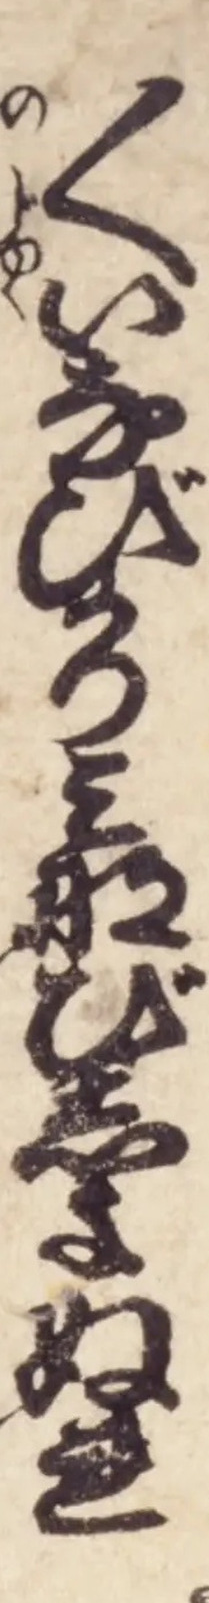〳〵いなびかりみなびしよぬれ
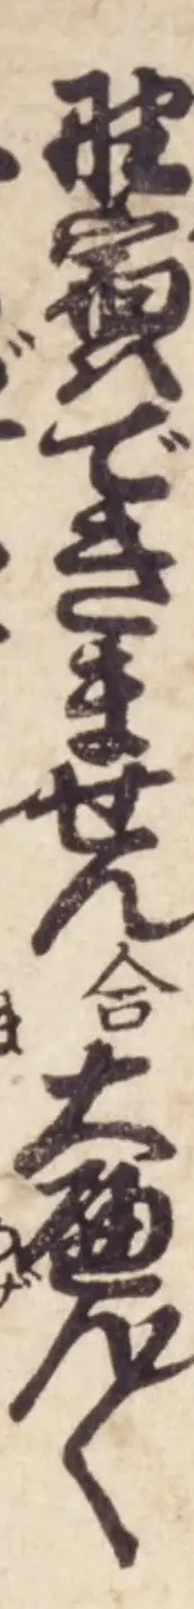野宿はできません合大へん〳〵
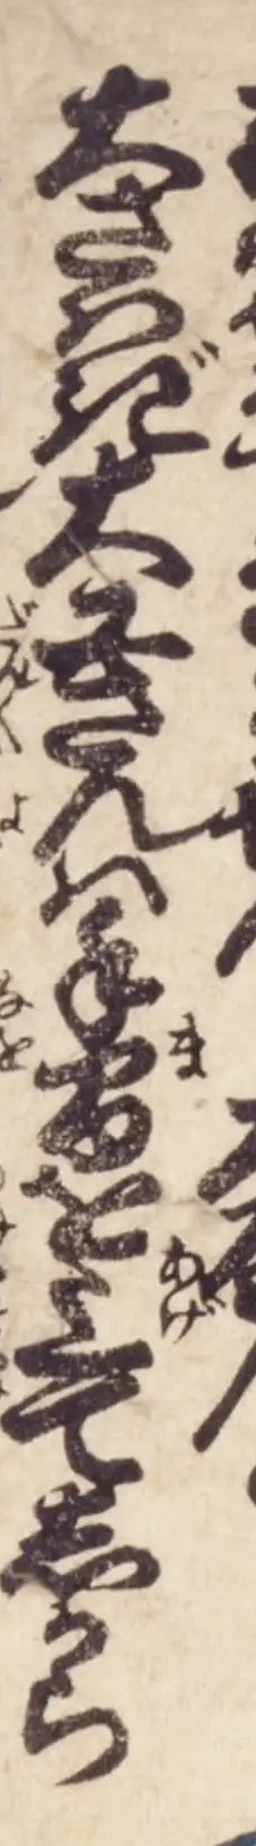大さはぎ大工さんは手間を上てしから
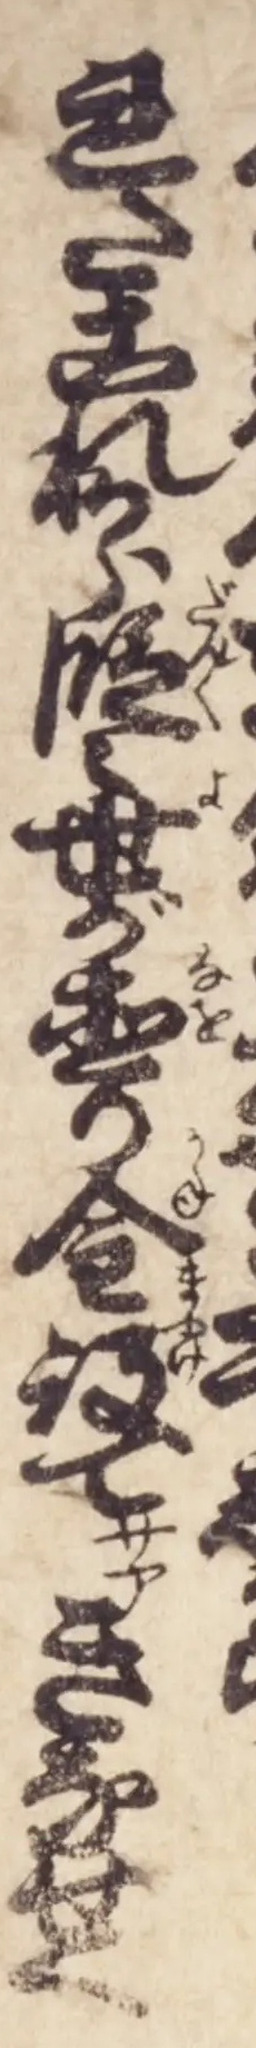れたこれから段々世が直り金設てサアきなせへ
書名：地震けん
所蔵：国立国会図書館 National Diet Library, JAPAN
